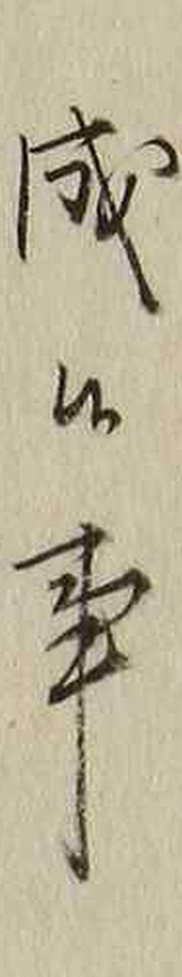成候事
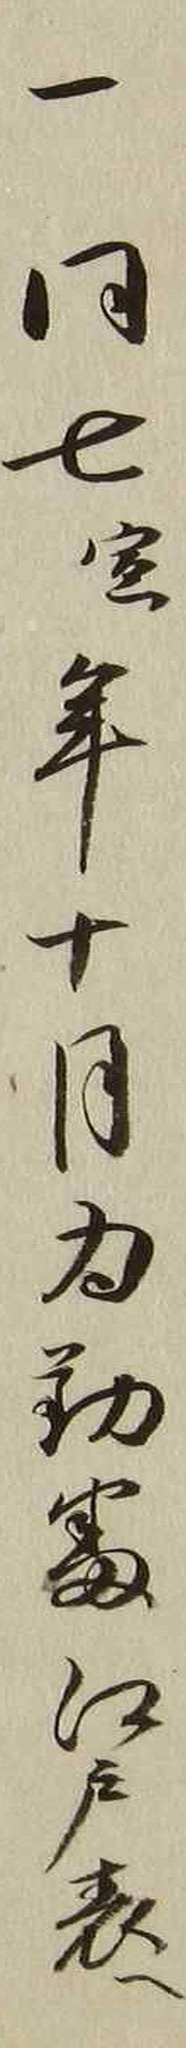一同七寅年十月為勤番江戸表へ
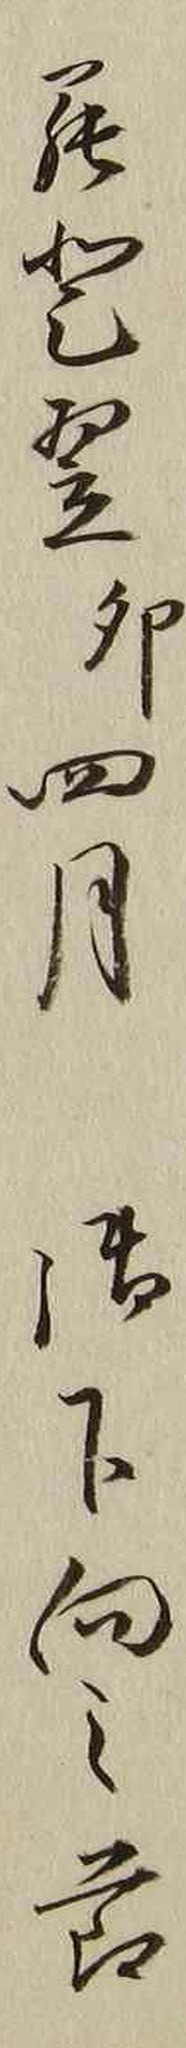罷登翌卯四月御下向之節
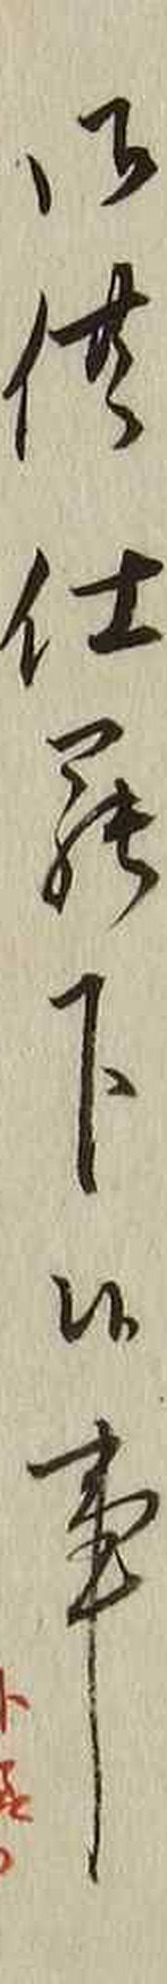御供仕罷下候事
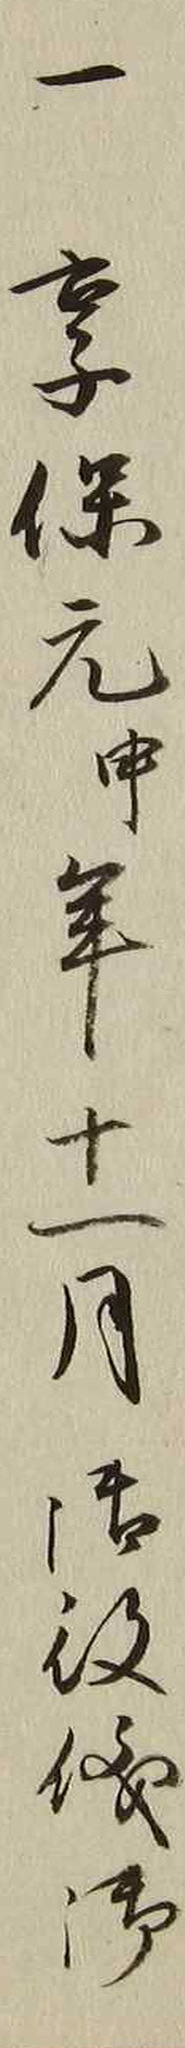一享保元申年十一月御役儀御
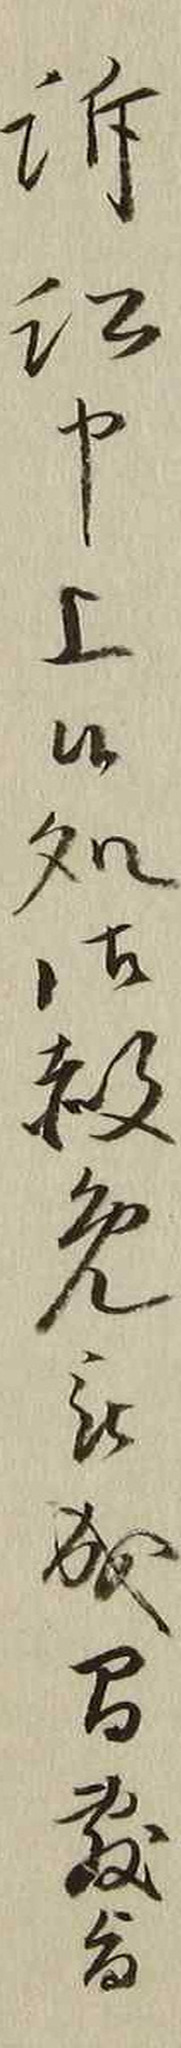訴訟申上候処御赦免被成間敷旨
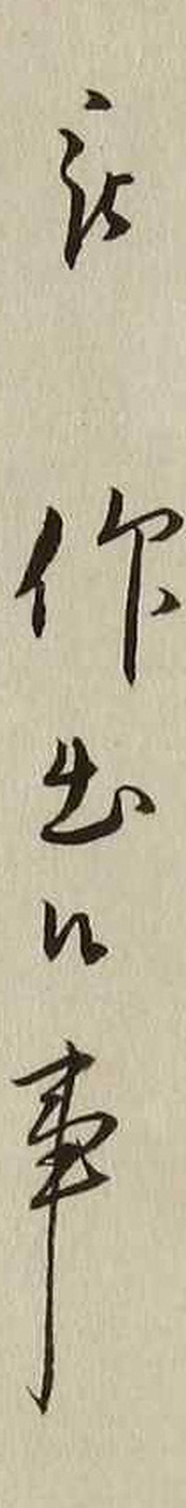被仰出候事
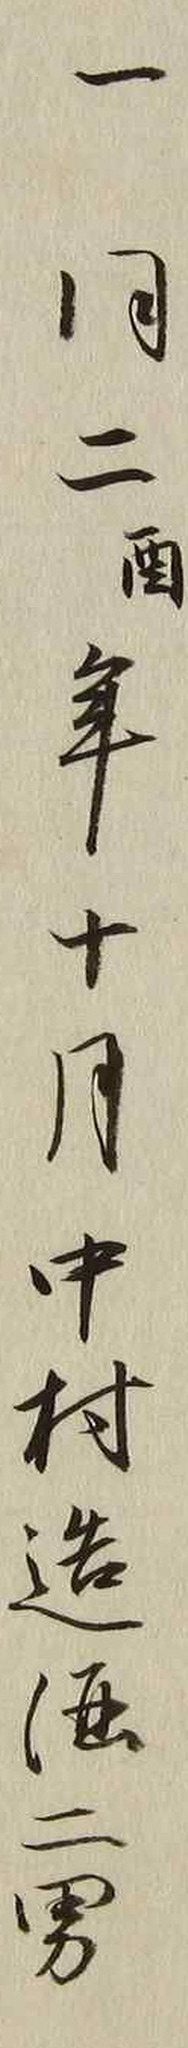一同二酉年十月中村造酒二男
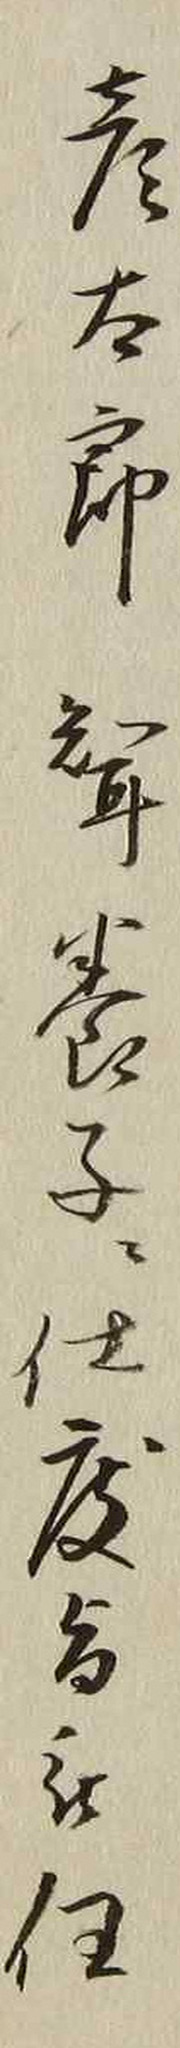彦太郎聟養子ニ仕度旨被任
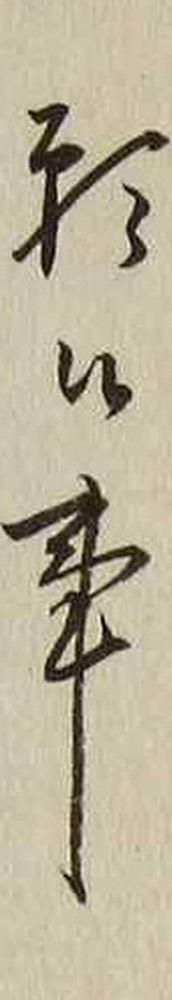願候事
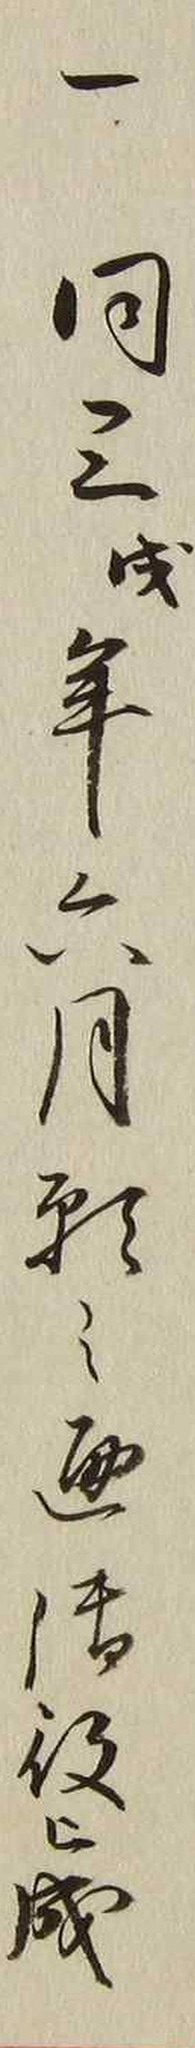一同三戌年六月願之通御役被成
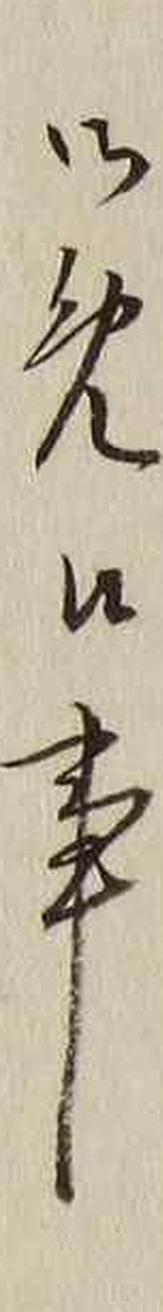御免候事
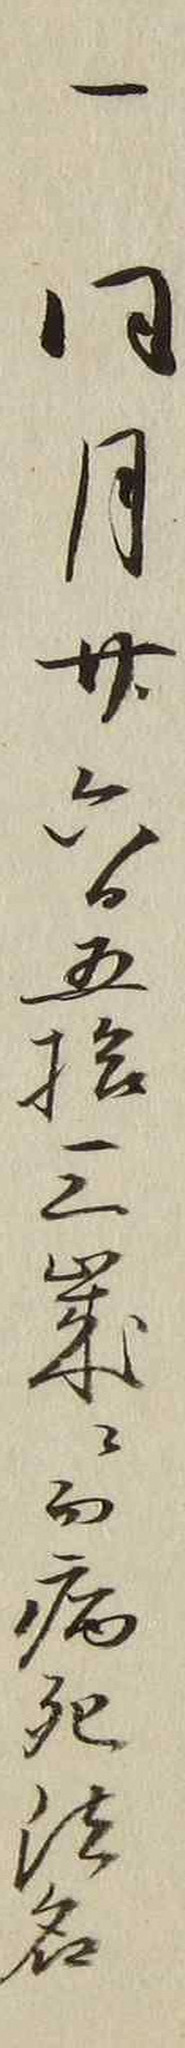一同月廿六日五拾三歳ニ而病死法名
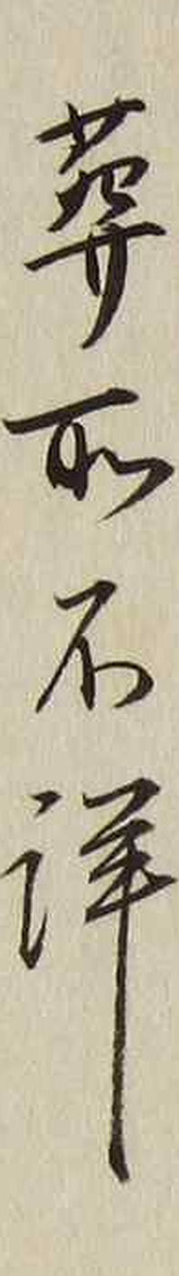葬所不詳
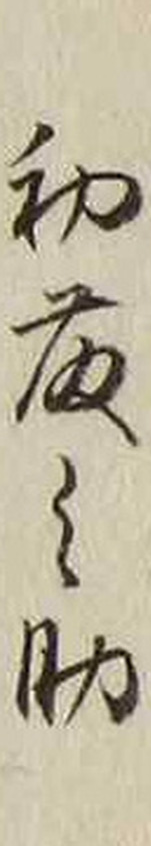初藤之助
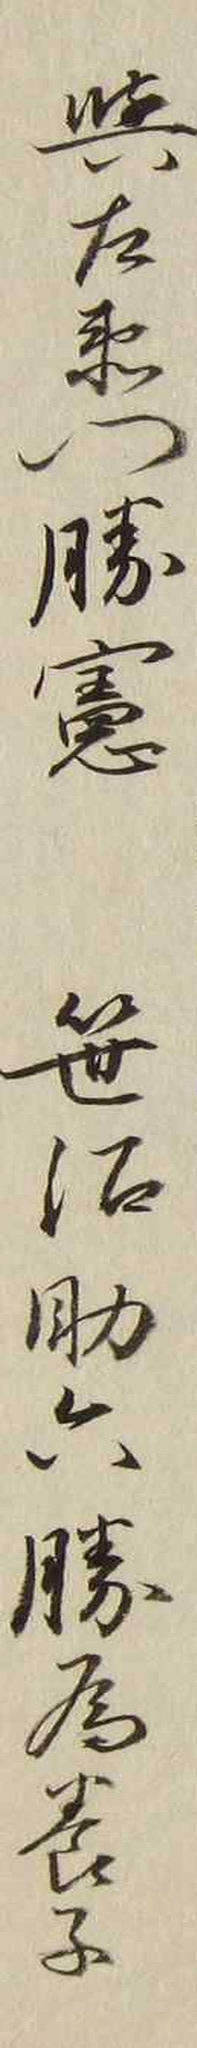与左衛門勝憲笹沼助六勝為養子
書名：諸士系譜　巻之22　い之部22
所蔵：会津若松市立会津図書館
